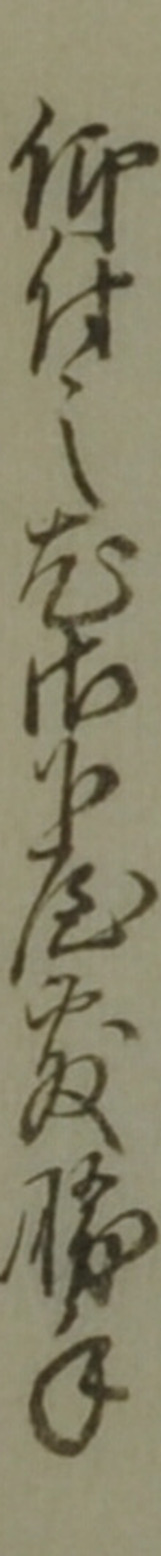仰付之尤御下屋敷勝手
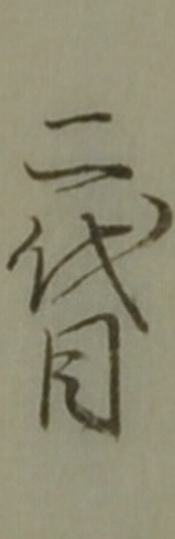二代目
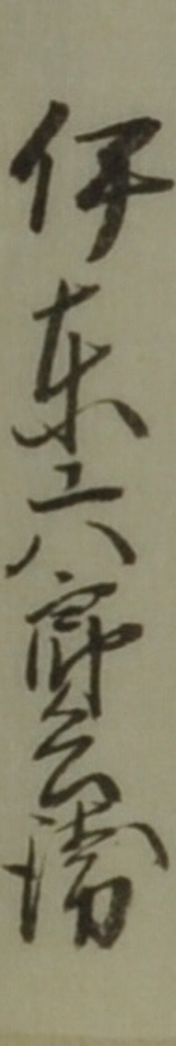伊東六郎兵衛
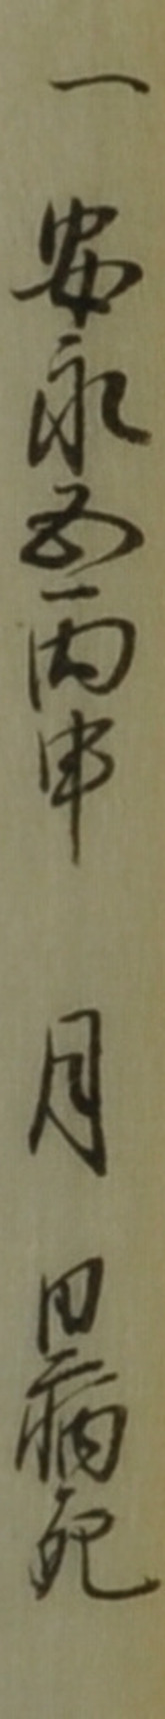一安永五丙申月日病死
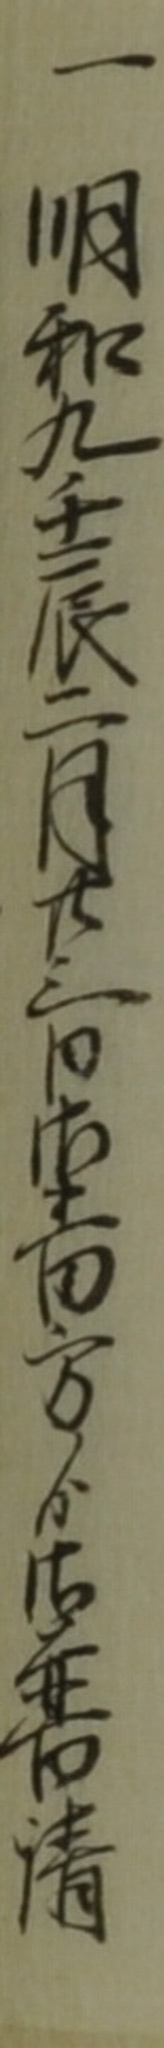一明和九壬辰二月廿三日御番方ゟ御普請
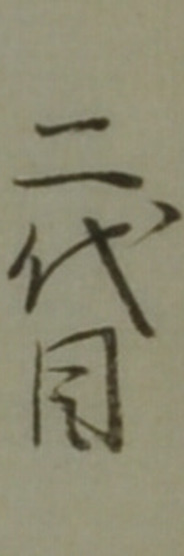二代目
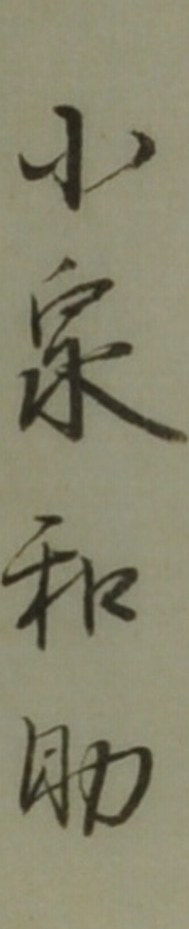小泉和助
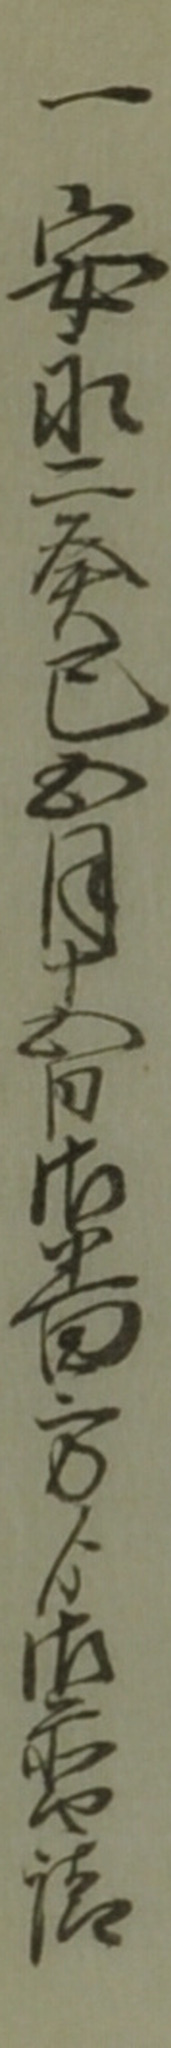一安永二癸巳五月十五日御番方ゟ御普請
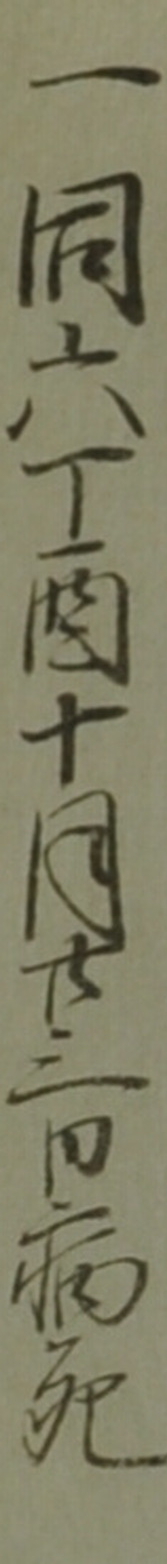一同六丁酉十月廿三日病死
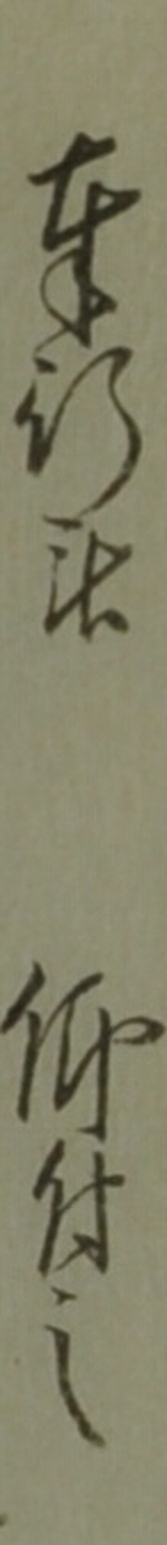奉行被仰付之
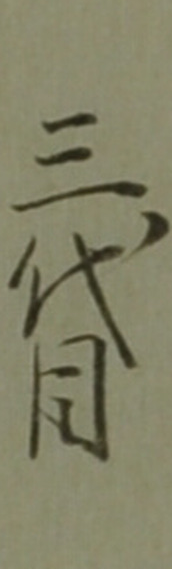三代目
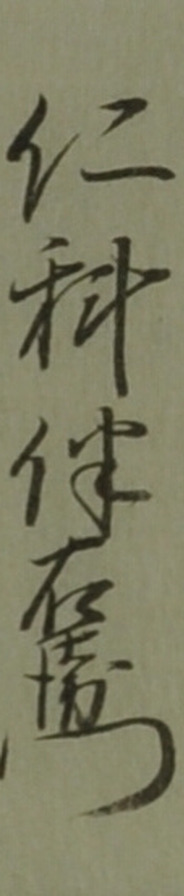仁科伴右衛門
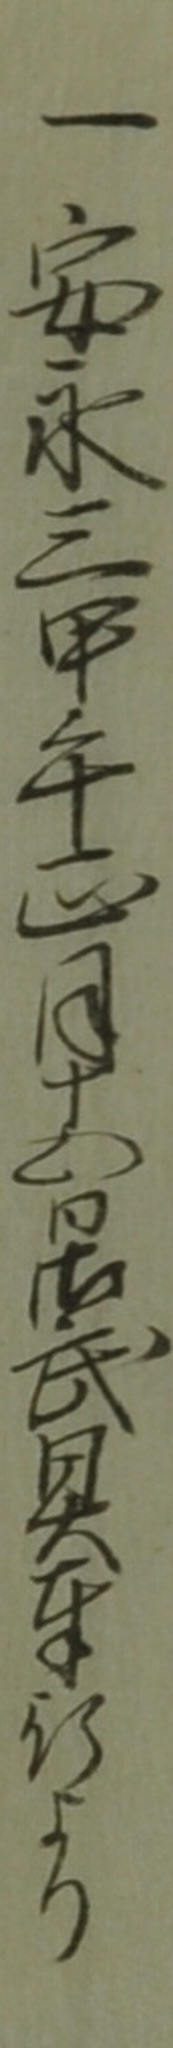一安永三甲午正月十五日御武具奉行より
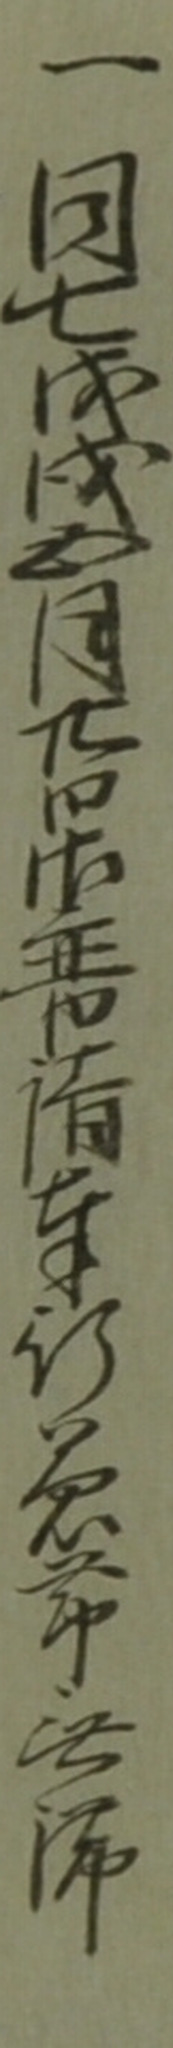一同七戊戌五月廿日御普請奉行兼帯無滞
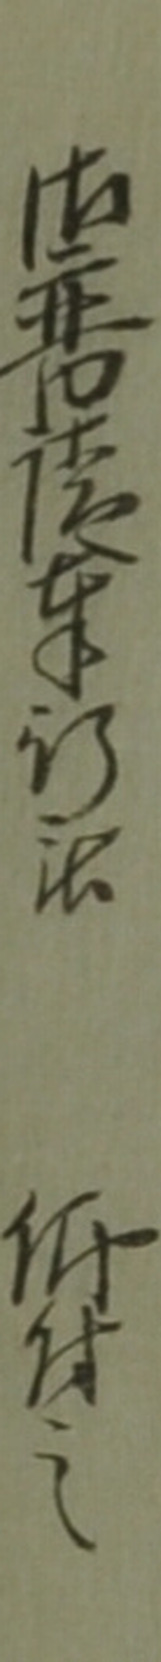御普請奉行被仰付之
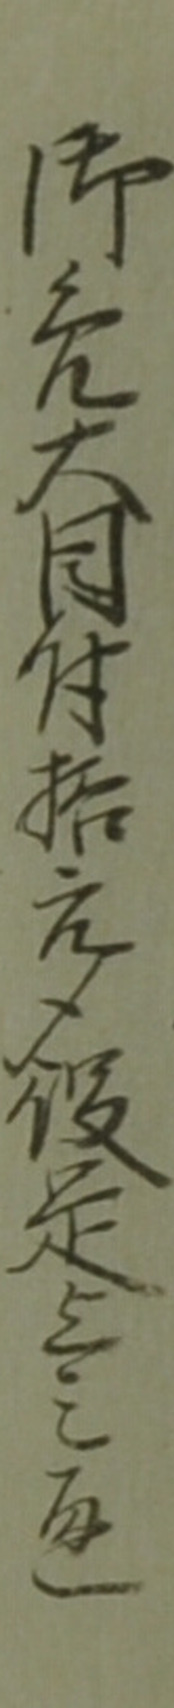御免大目付格元〆役是迄之通
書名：諸御役代々録（六）
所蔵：伊那市立高遠町図書館・合同会社AMANE
